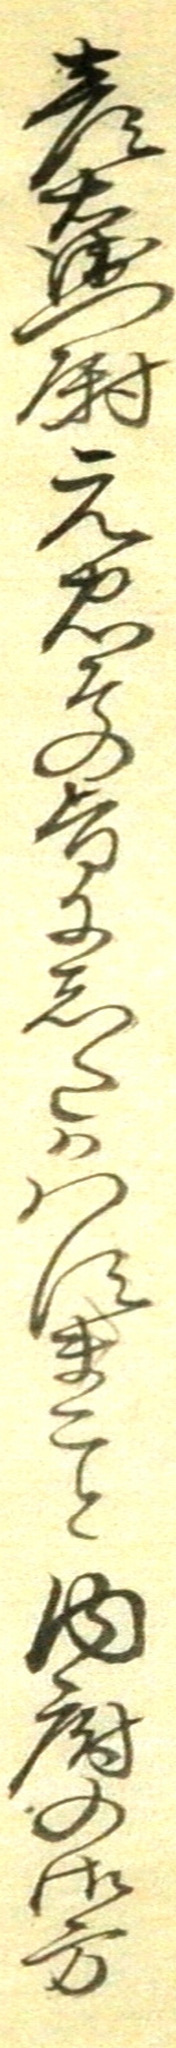彦右衛門尉元忠その旨にしたかはすまこと内府の御方
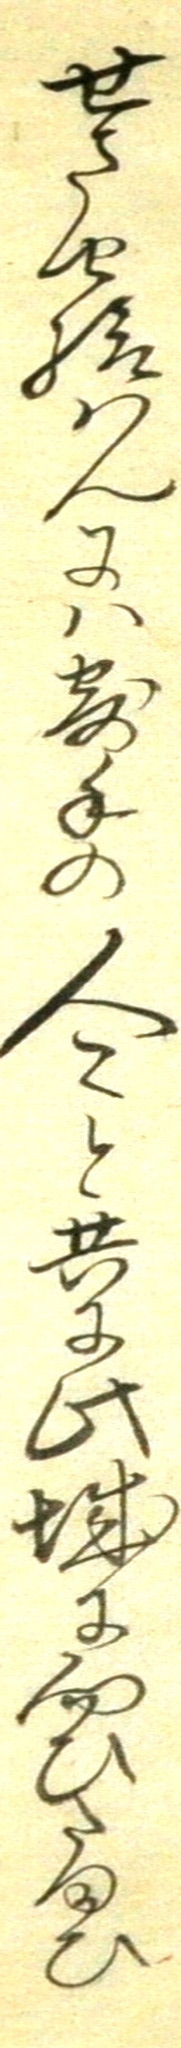せさ候由給はんには寄年の人々と共に此城に向ひたまひ
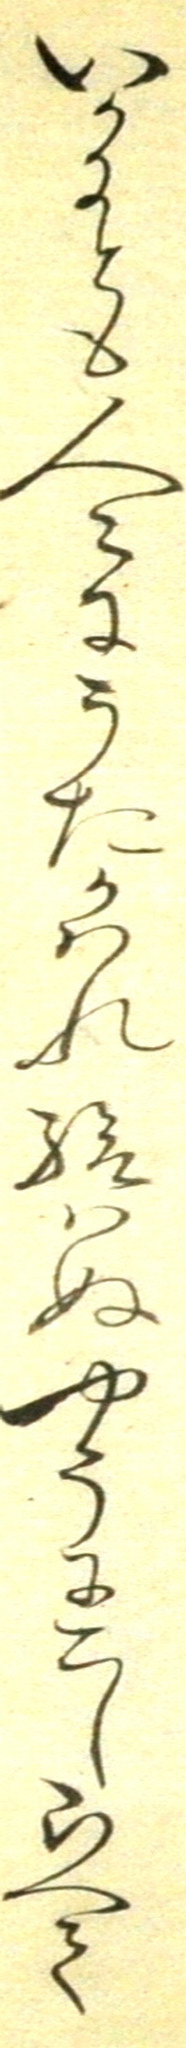いかにとも人々ｎにうたかはれ給はぬやうにこしらへて
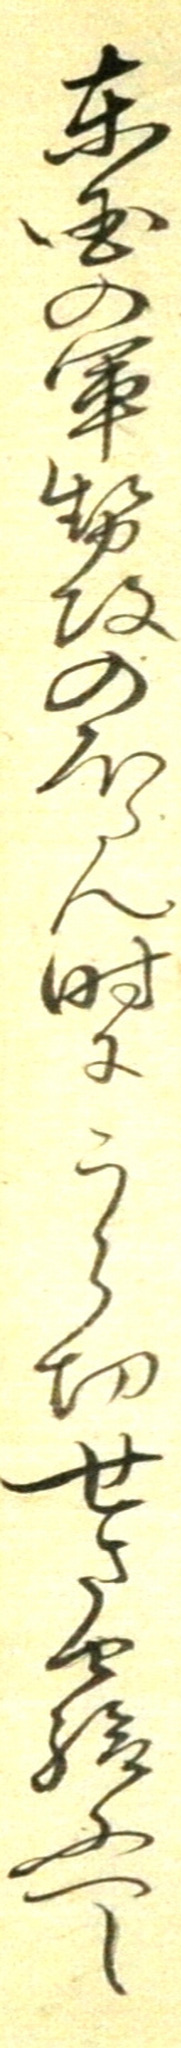東国の軍勢攻のほらん時にうら切させ由給ふへし
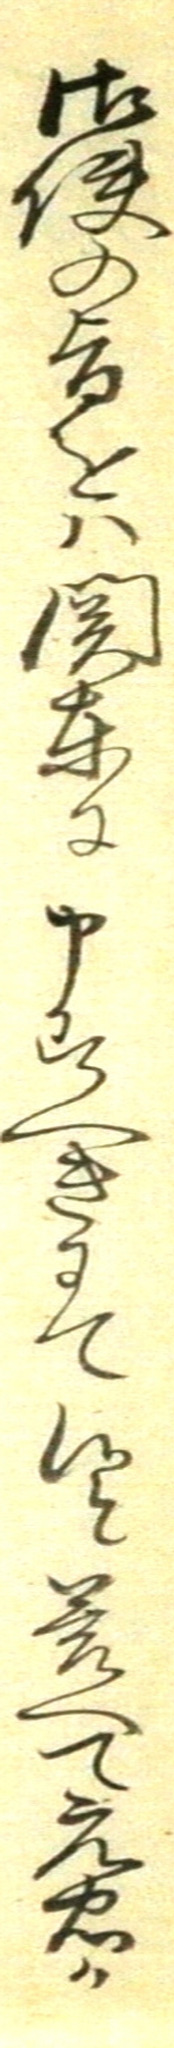御使の旨をは関東に申すへきにて候と答へて元忠か
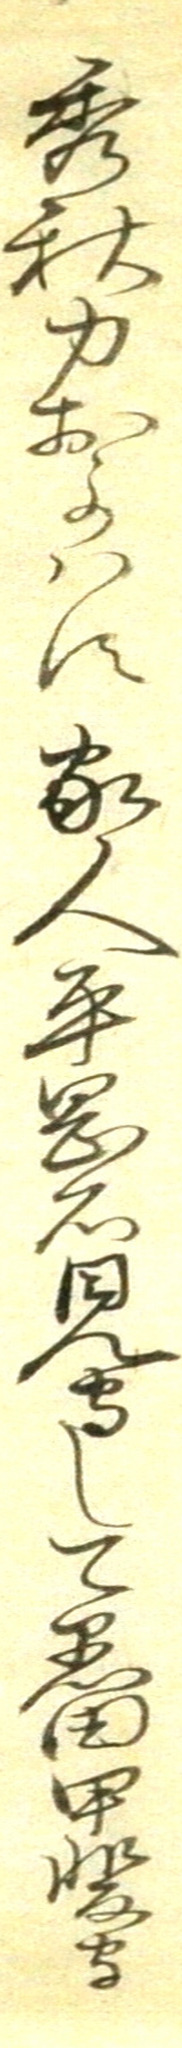秀秋力およはす家人平岡石見守して黒田甲斐守
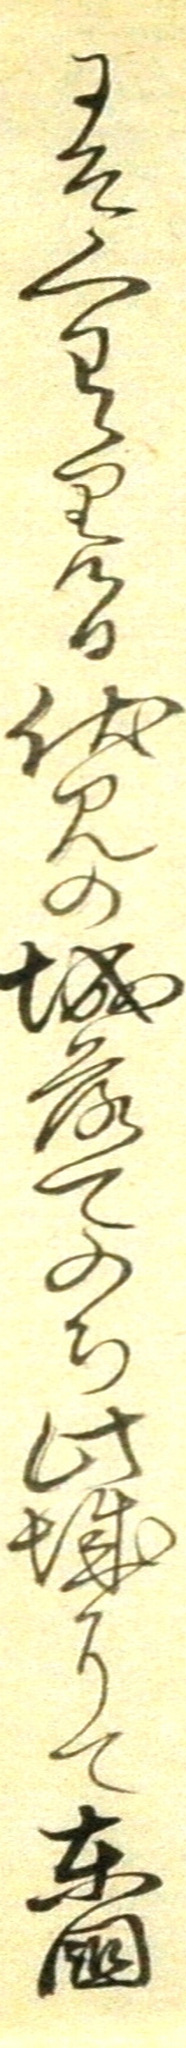にそくわゝりける伏見の城落てのち此城にて東国
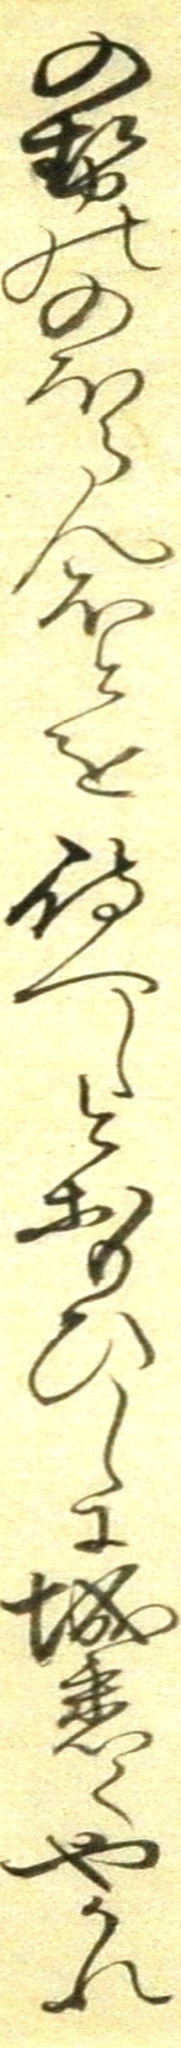のせののほらんほとを侍へしへしとおもいひしに城悉くやかれ
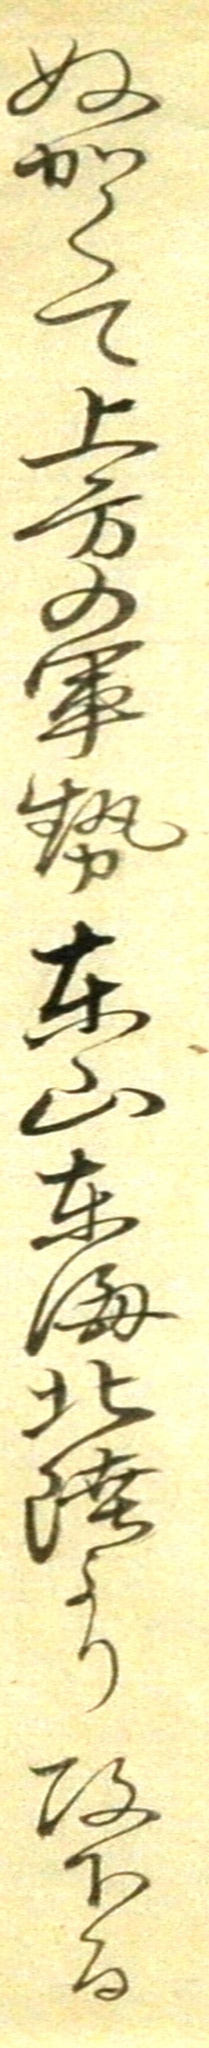ぬかくて上方の軍勢東山東海北陸より攻下る
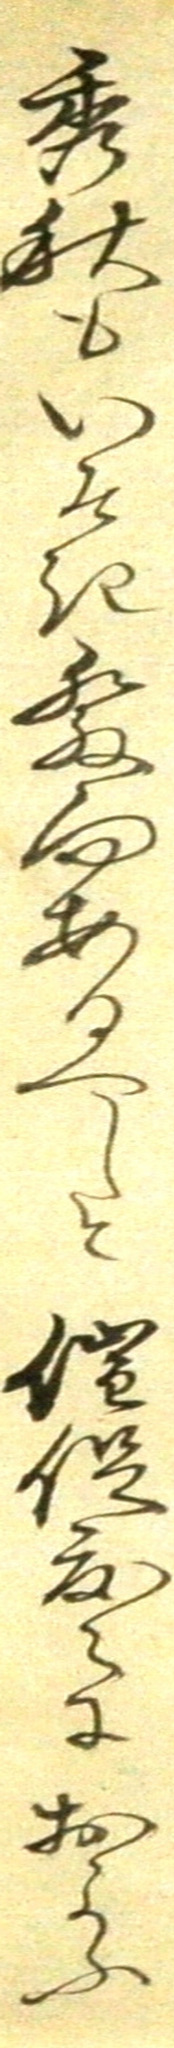秀秋もいそき発向あるへしと催促度々におよふ
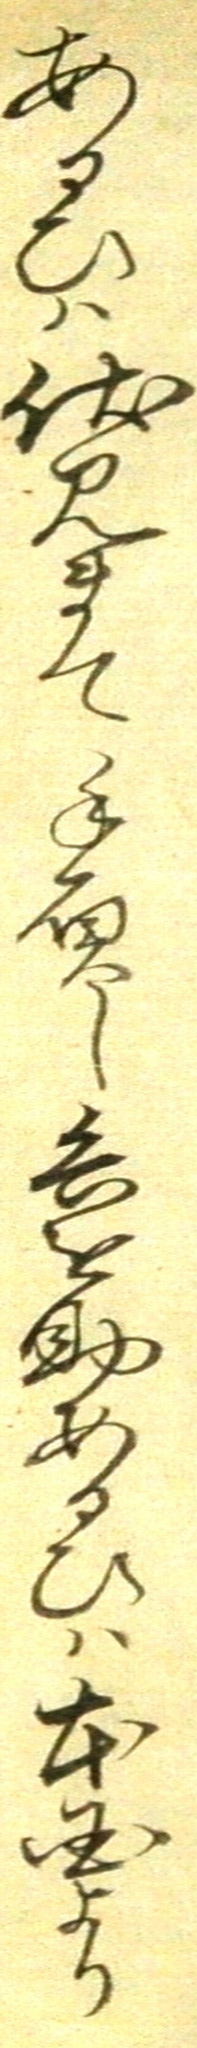あるひは伏見まて手負し兵を助あるひは本国より
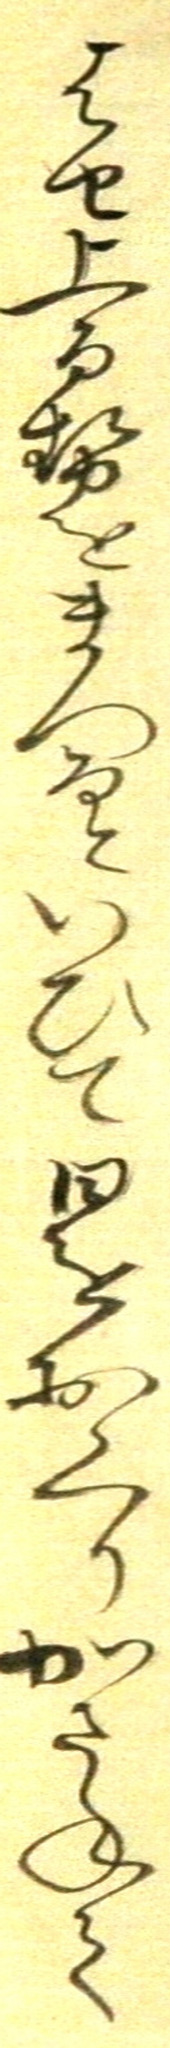はせ上る勢をまつるといひて日をおくりかさねて

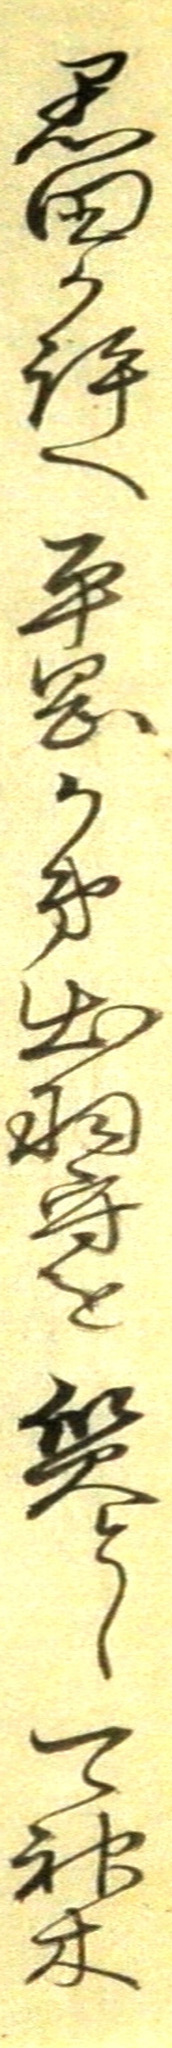黒田か許へ平岡か弟出羽守を質として神木
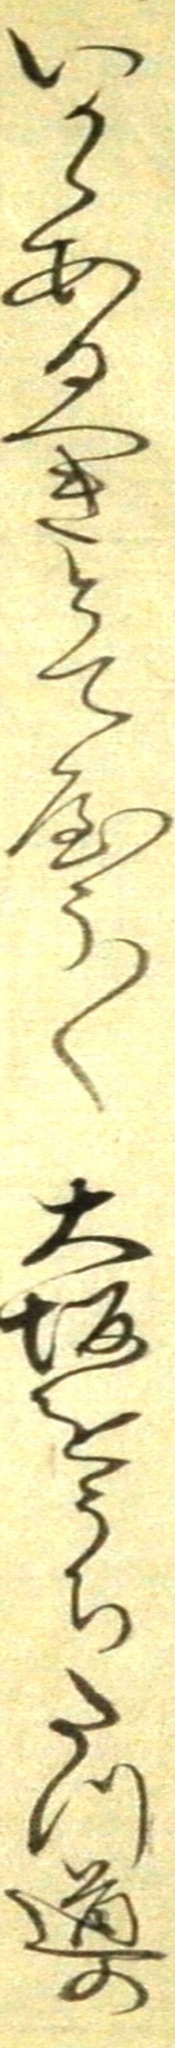いからあるへきとてやう〳〵大坂をうちたつ道の
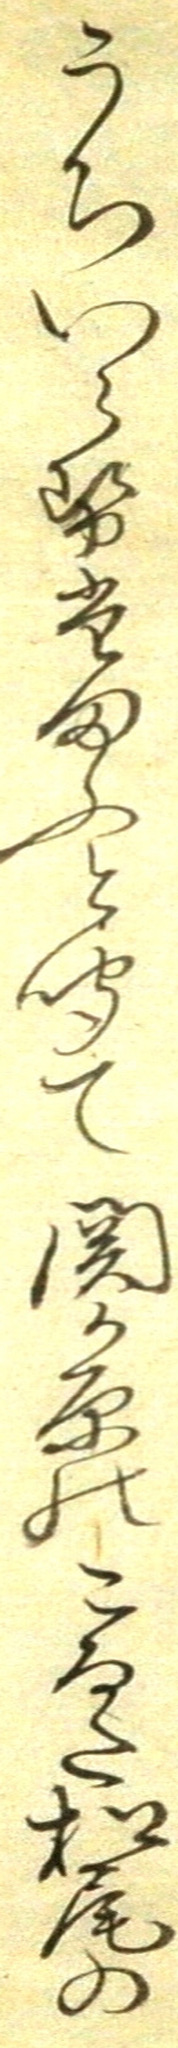うちいらせたまふと聞て関か原のこなた松尾の
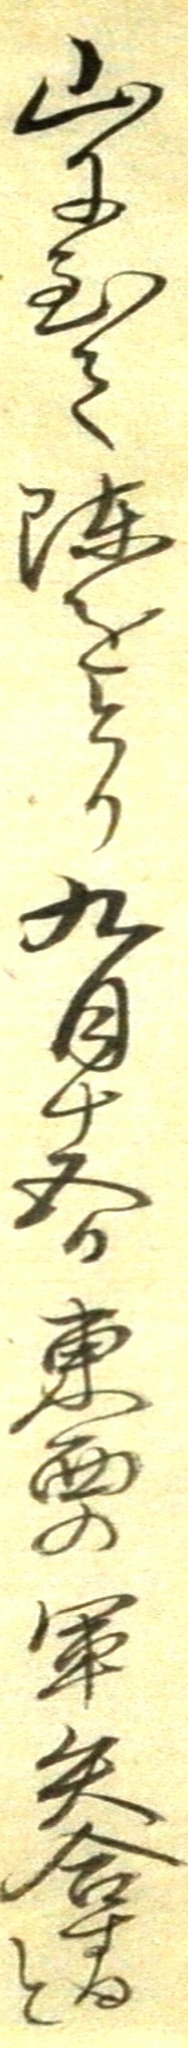山に至て陣をとり九月十五日東西の軍矢合すると
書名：藩翰譜（十二・上）
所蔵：伊那市立高遠町図書館・合同会社AMANE
